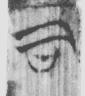司
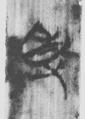事
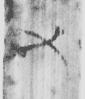又
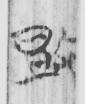{豆攴}
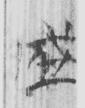城
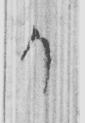人
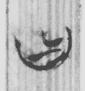曰
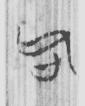句
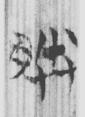朕
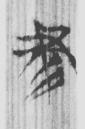𦘔
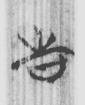告
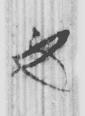女
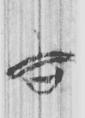吉
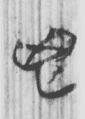兇
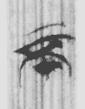不
